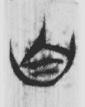自
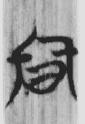冬
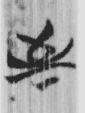至
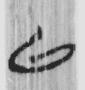㠯（以）
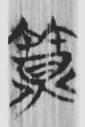{竹鼎}
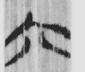六
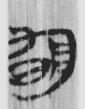旬
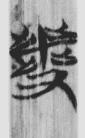{歮十廾}
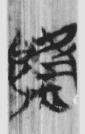{既火}
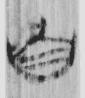自
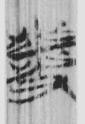{歮十廾}
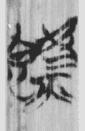{即火}
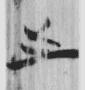之
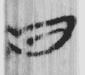日
